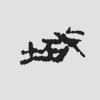堵
